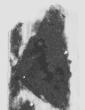非
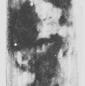山
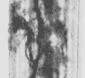川
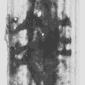但
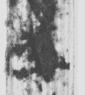{木土}
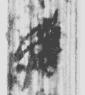后
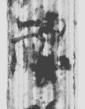禝
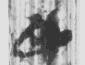㠯（以）
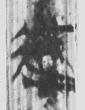﨤
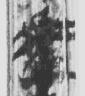𫊟
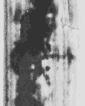先
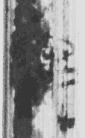祖
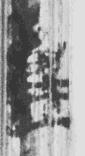皇
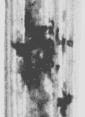示
